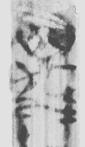澫
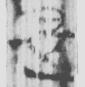是
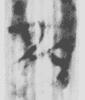多
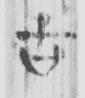古
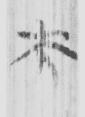夫
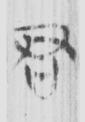君
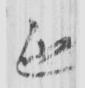臣
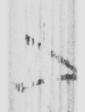之
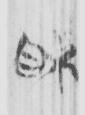相
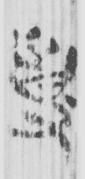事
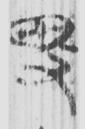卑
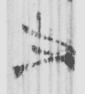之
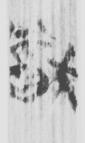猶
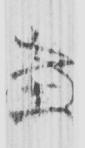市
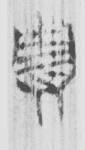賈
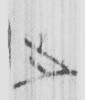之
